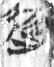○（屈）
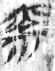○（夕）
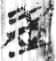○（建）
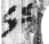於
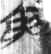寅
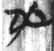卯
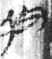於
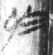於
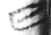巳
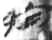於
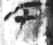午
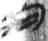於
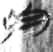於
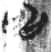申
